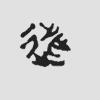逃
